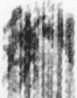厀（漆）
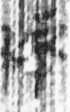杯
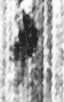十
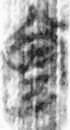合
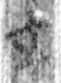才（在）
